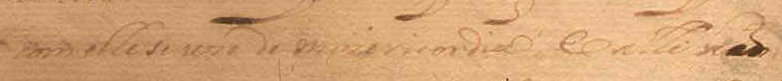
com elle se uze de mizericordia e alli naõ
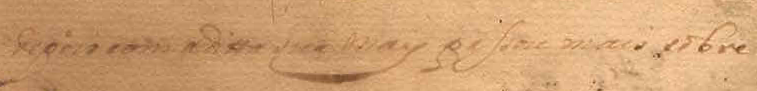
depois com a ditta sua may passou mais sobre
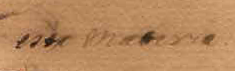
esta materia.
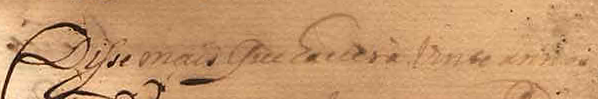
Disse mais hauerà vinte annos
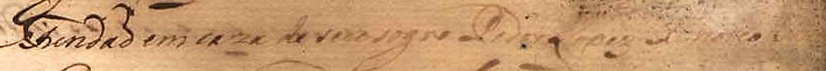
Fundaõ em caza de seu sogro Pedro lopes x nouo som
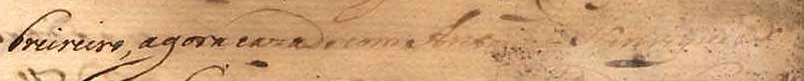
breireiro, agora cazado com Antonia Henriques x
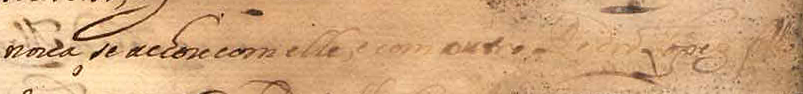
noua, se achou com elle, e com outro Pedro Lopez filho
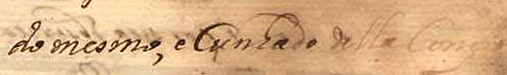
do mesmo, e Cunhado della Conp_
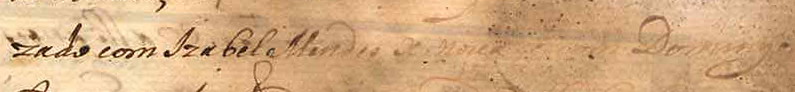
zado com Izabel Mendes x noua _ com Domingo
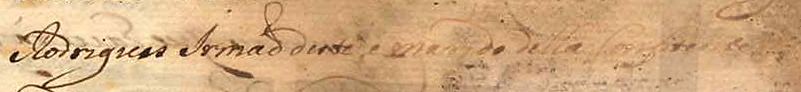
Rodrigues Irmaõ e marido della Confitente
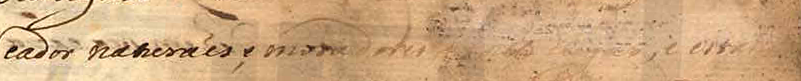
cador naturaes, e moradores _ lugares, e estando
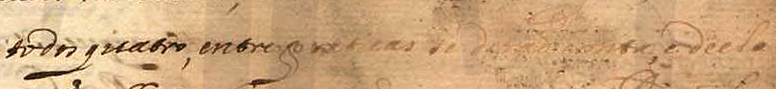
todos quatro, entre praticas se deraõ conta, e decla
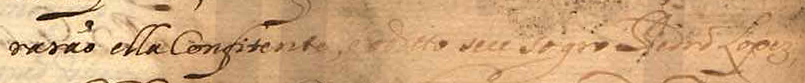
raraõ ella Confitente, e o ditto seu sogro Pedro Lopez,
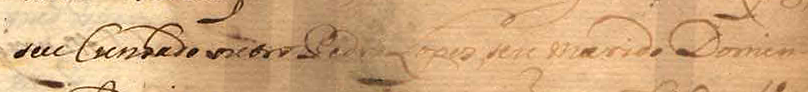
seu Cunhado outro Pedro Lopes, seu marido Domin
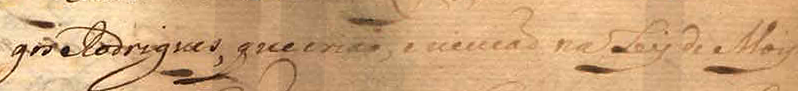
gos Rodrigues, que criaõ na Ley de Moy
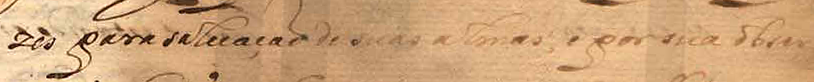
zes para saluaçaõ de suas almas, e por sua obser
